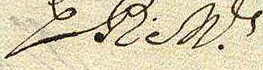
E R M.e
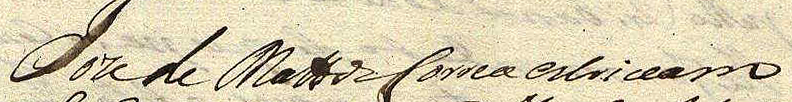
Ioze de Mattoz Correa escriuam
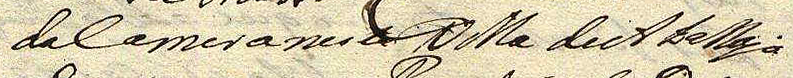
da Camera nesta Villa de Atallaja
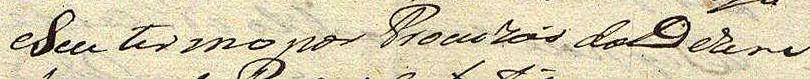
e Seu termo por Prouizaõ do Dezem
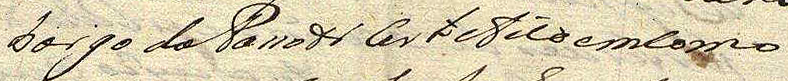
bargo do Passo &r Certifico em como
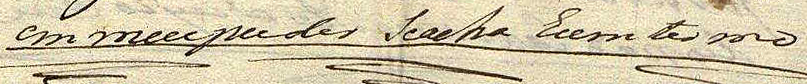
em meu puder se acha hum termo
